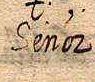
Senōr
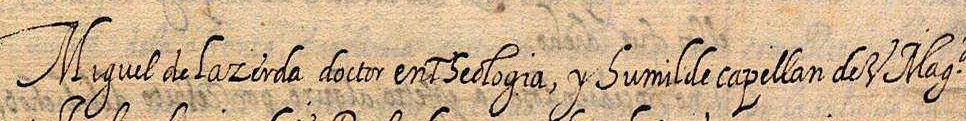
Miguel de lazerda doctor en Theologia, y humilde capellan de V Mag.d
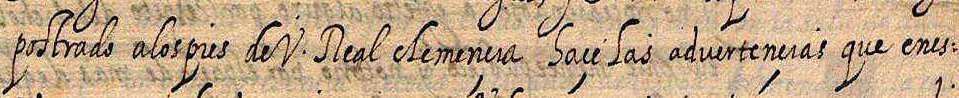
postrado a los pies de V. Real clemencia hace las aduertencias que en es
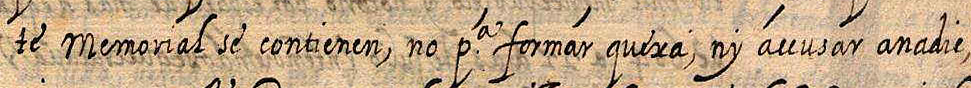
te memorial se contienen, no p.a formar quexa, ny accusar a nadie,
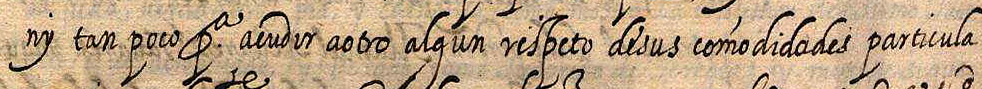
ny tan poco p̄.a acudir a otro algun respeto de sus com̄odidades particula
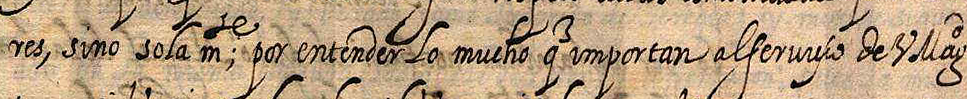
res, sino solam.te por entender lo mucho q̄ importan al seruicio de V Mag.d
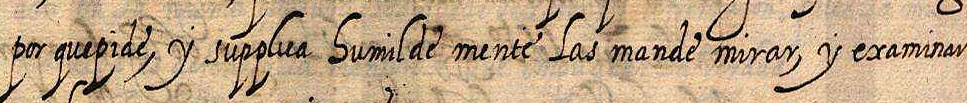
por que pide, y supplica humildemente las mande mirar, y examinar
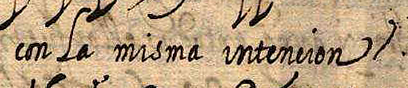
con la misma intencion.
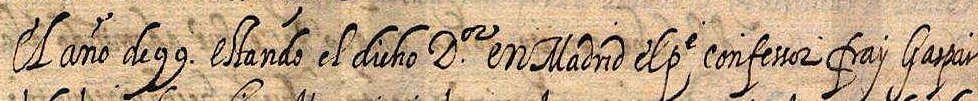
El an̄o de 99. estando el dicho D.or en Madrid el pe confessor fray Gaspar
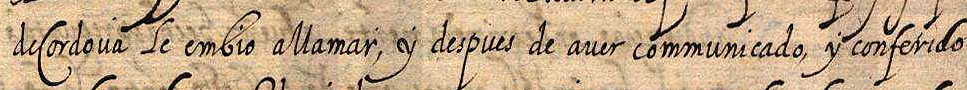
de Cordoua le embio a llamar, y despues de auer communicado, y conferido
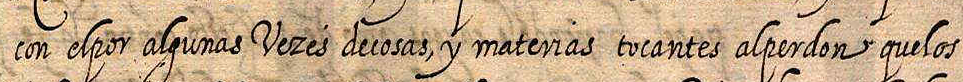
con el por algunas Vezes de cosas, y materias tocantes al perdon que los
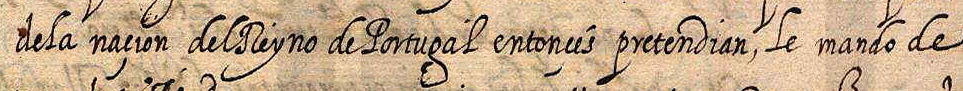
de la nacion del Reyno de Portugal entonces pretendian, le mando de
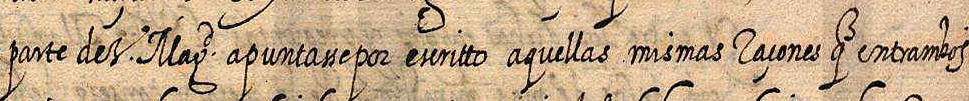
parte de V. Mag.d apuntasse por escritto aquellas mismas Raçones q̄ entrambos
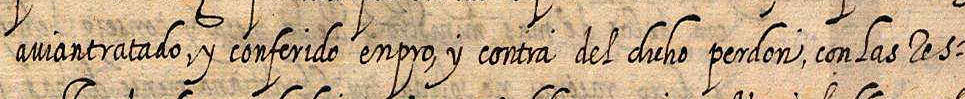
auian tratado, y conferido en pro, y contra del dicho perdon, con las Res
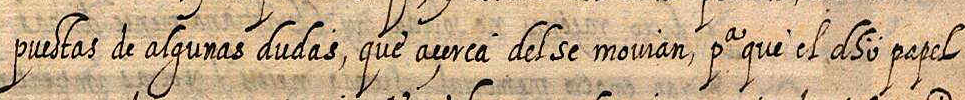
puestas de algunas dudas, que acerca del se mouian, p.a que el dho papel
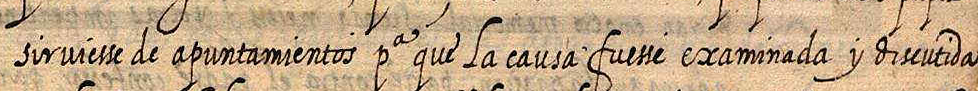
siruiesse de apuntamientos pa que la causa fuesse examinada y discutida
